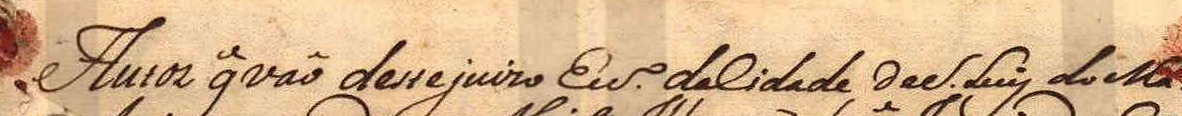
Autos q̄ vaõ deste juizo Ecc.o da Cidade de S. Luis do Ma
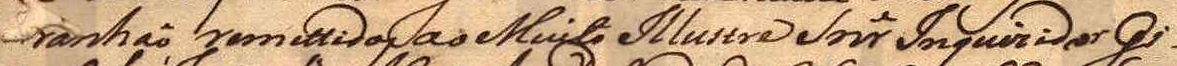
ranhaõ, remettidos ao Muito Illustre Snr̄ Inquizidor Gi
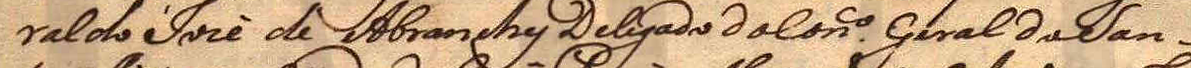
raldo Iozè de Abranches Delegado do Con.co Geral do San
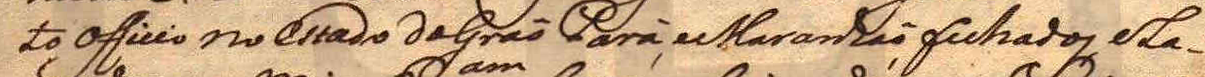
to officio no estado do Graõ Parà, e Maranhaõ, fechados, e La
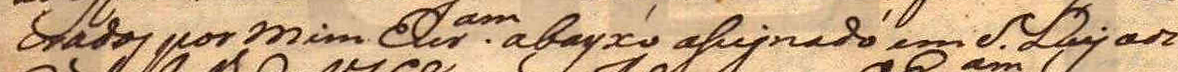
crados por mim Escr.am abayxo assignado em S. Luis aos
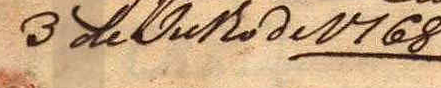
3 de Iulho de 1768
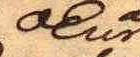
o Escr.am
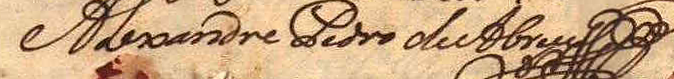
ALexandre Pedro de Abreu
